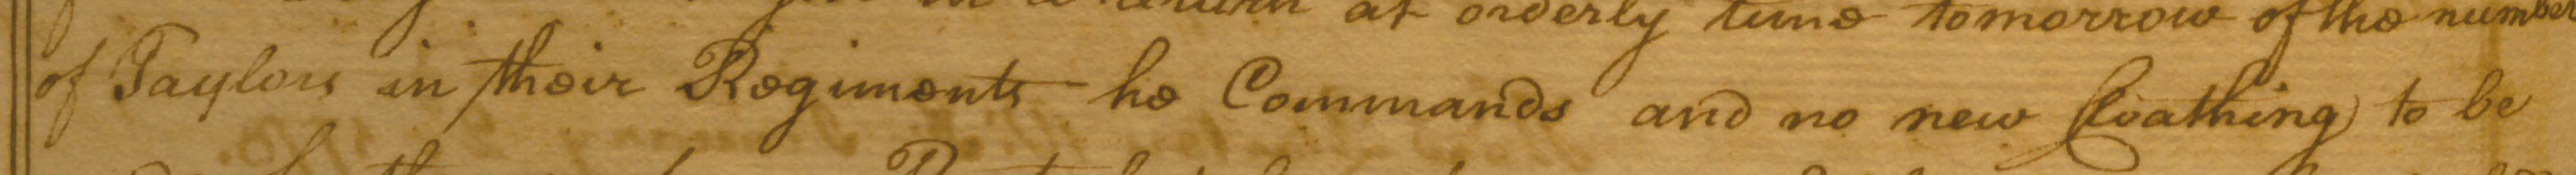of Taylors in their Regiments he Commands and no new Cloathing to be
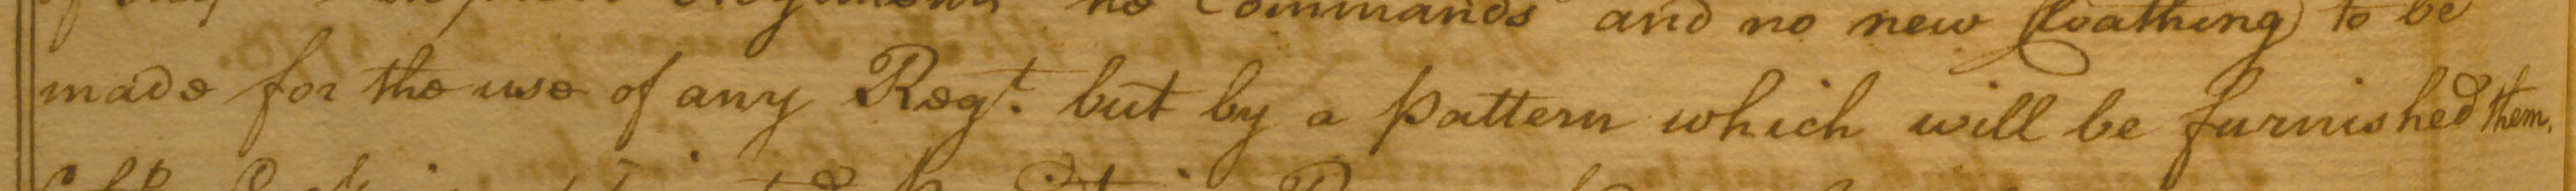made for the use of any Reg^t. but by a pattern which will be furnished them.
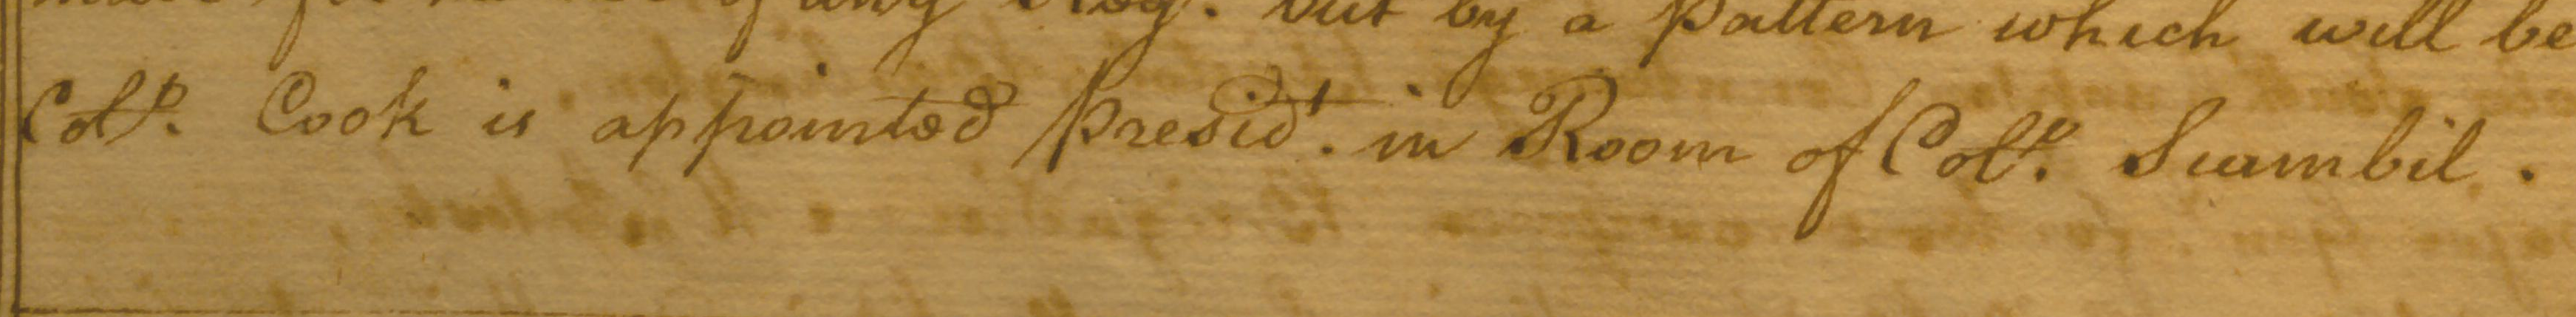Col^o. Cook is appointed presid^t. in Room of Col^o. Scambil.
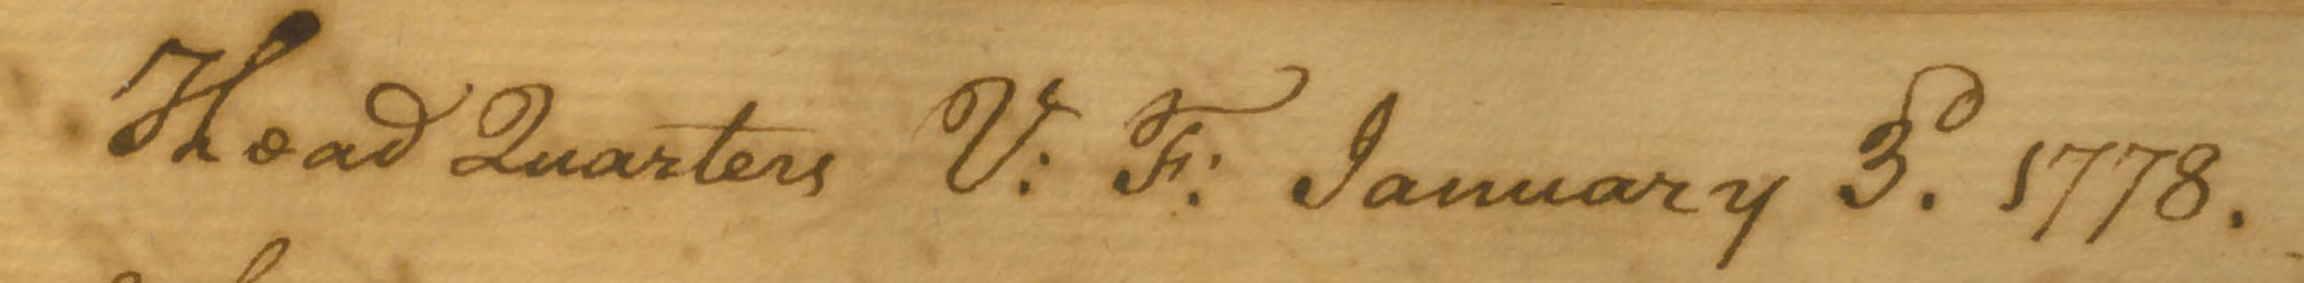Head Quarters V: F: January 3^d. 1778.
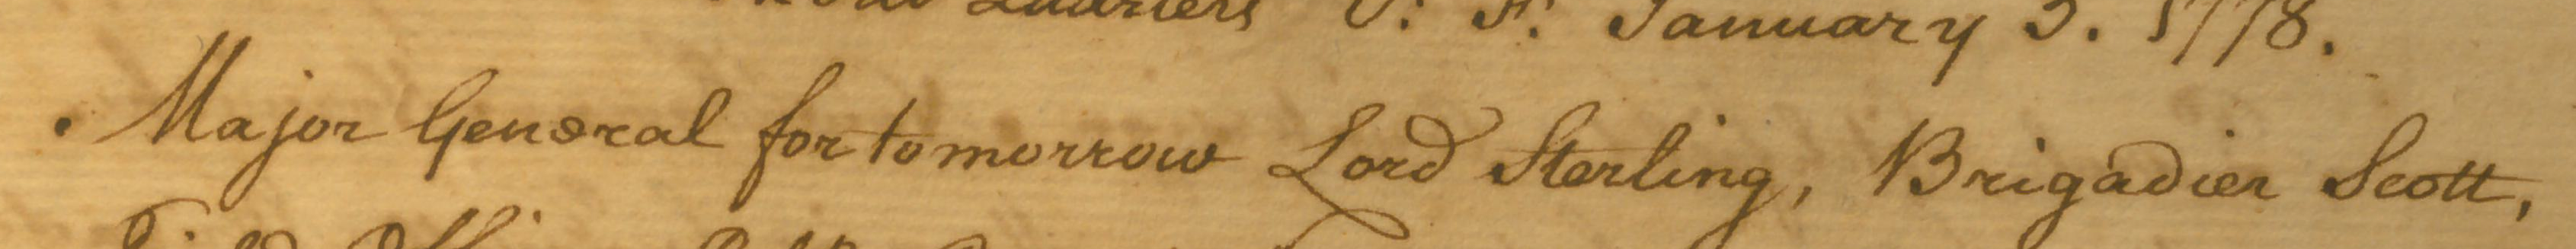Major General for tomorrow Lord Sterling, Brigadier Scott,
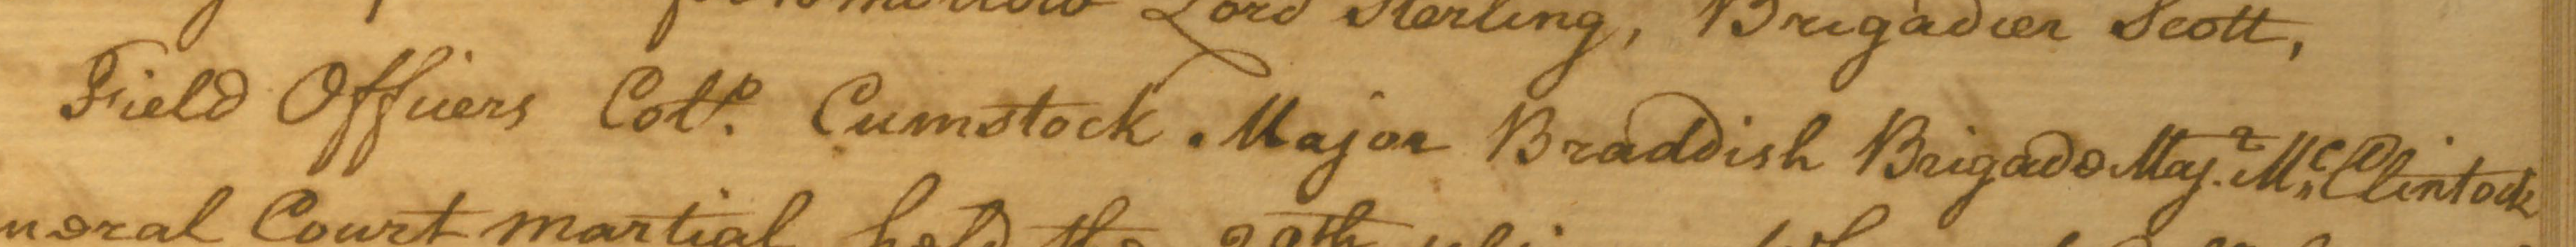Field Officers Col^o. Cumstock. Major Braddish Brigade Maj^r. M^c.Clintock
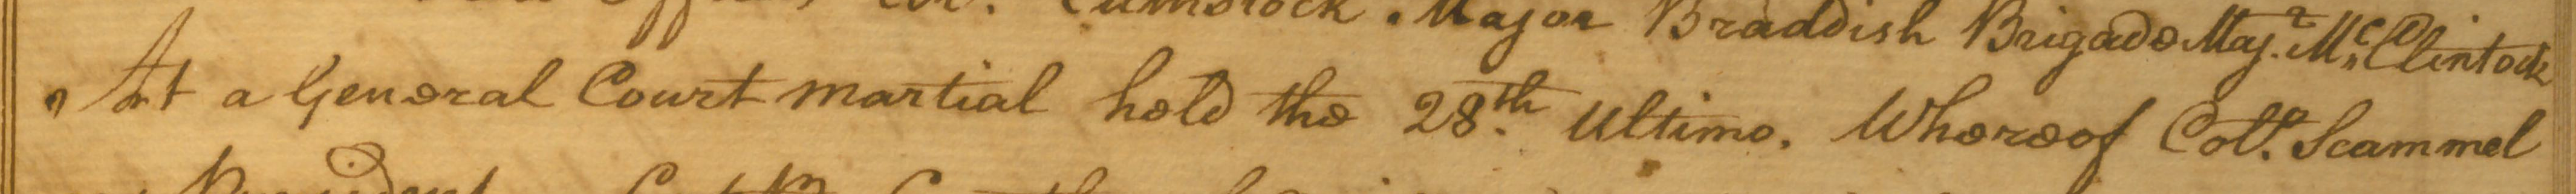At a General Court martial held the 28^th. ultimo. Whereof Col^o. Scammel
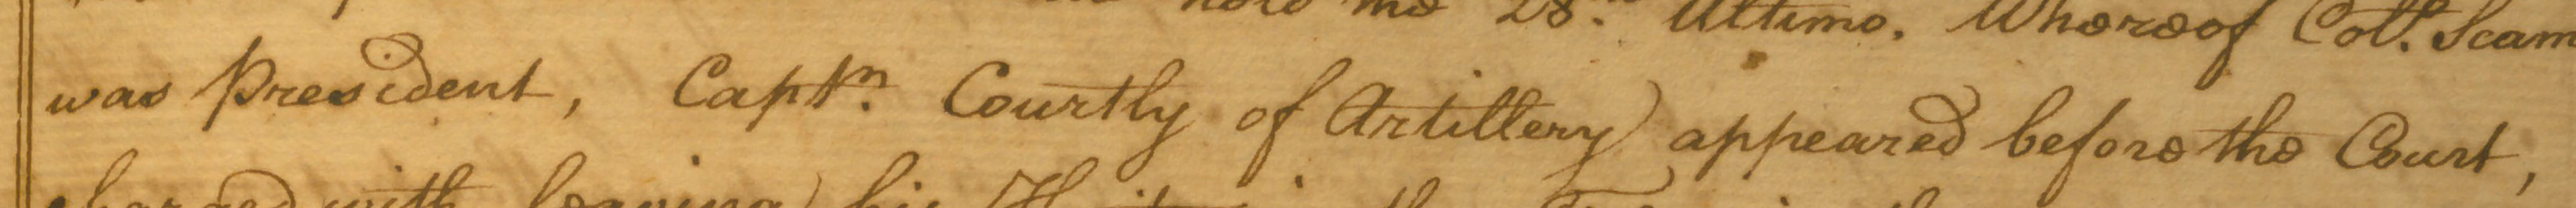was President, Capt^n. Courtly of Artillery appeared before the Court,
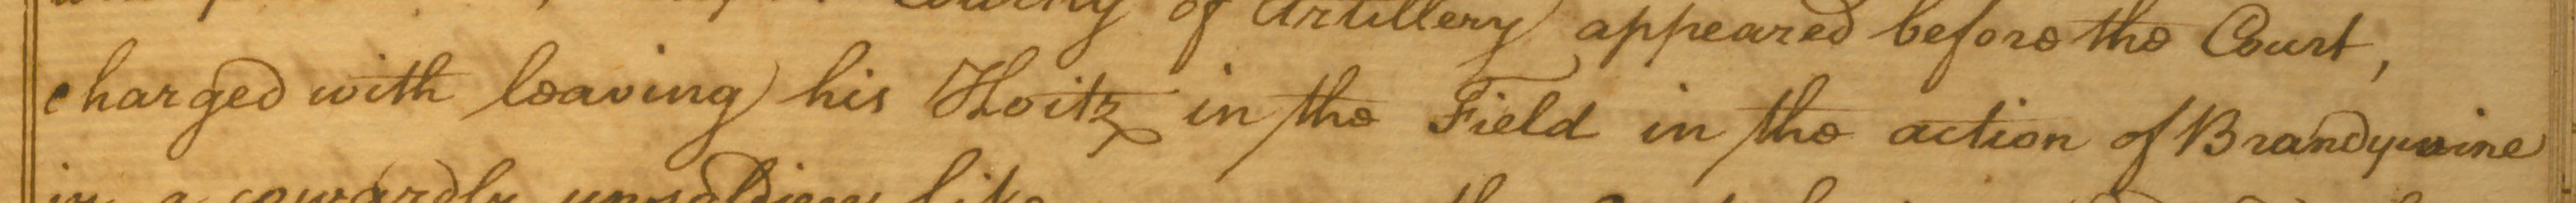charged with leaving his Hoitz in the Field in the action of Brandywine
